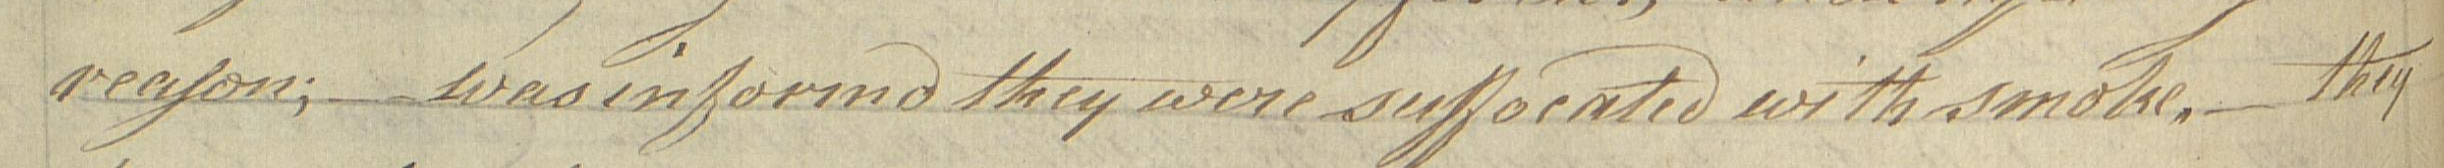reason; was informd they were suffocated with smoke. they
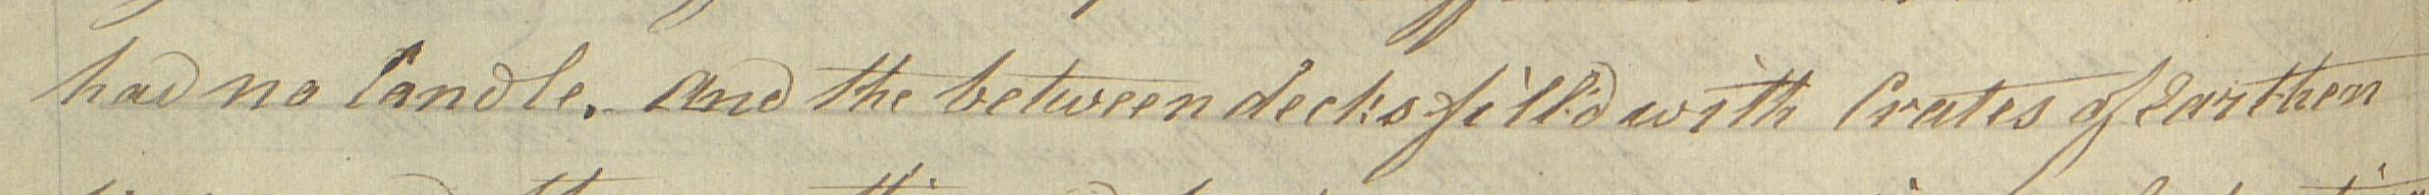had no Candle, and the between decks fill'd with Crates of Earthen
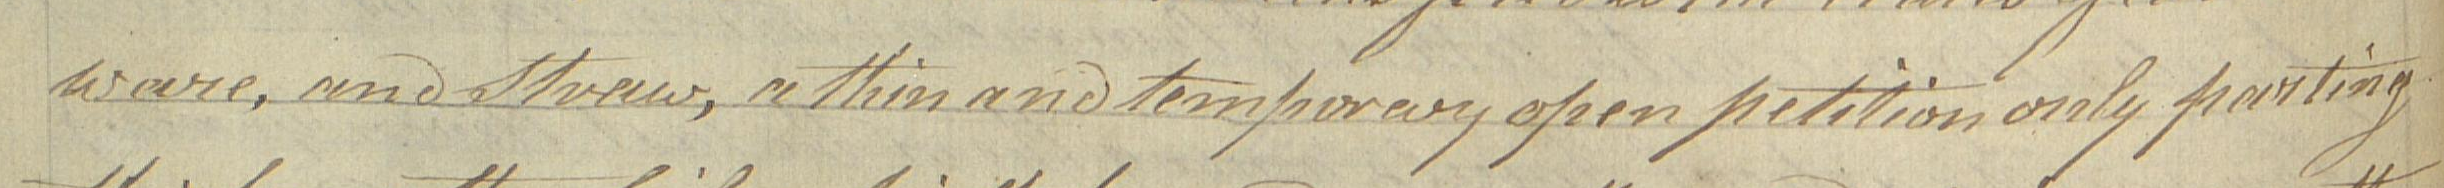ware, and Straw, a thin and temporary open petition only parting
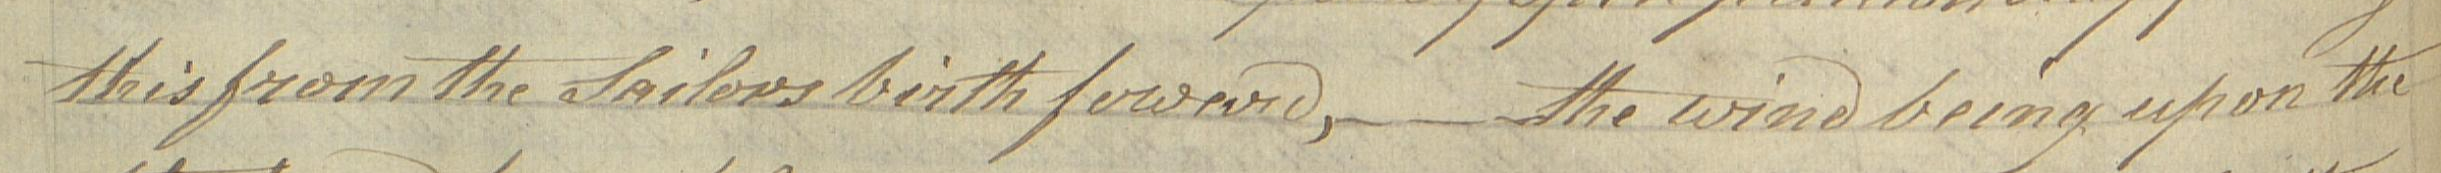this from the Sailors birth forward, the wind being upon the
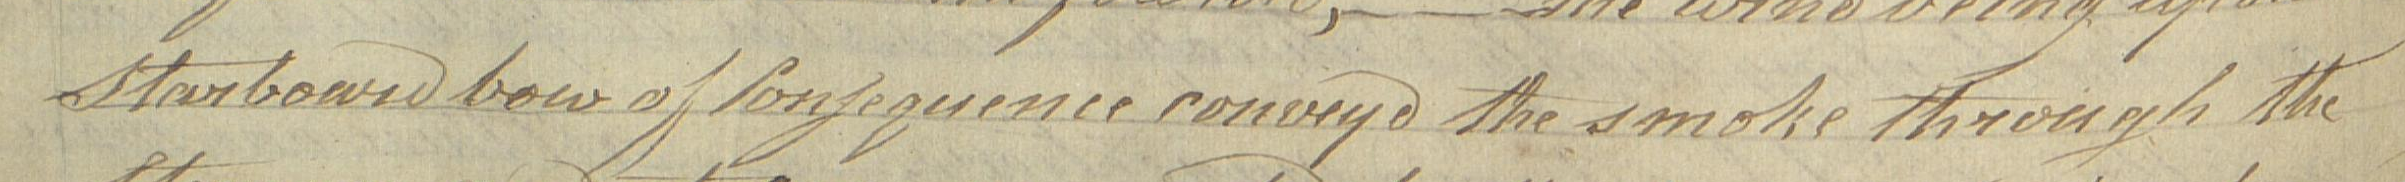Starboard bow of Consequence convey'd the smoke through the
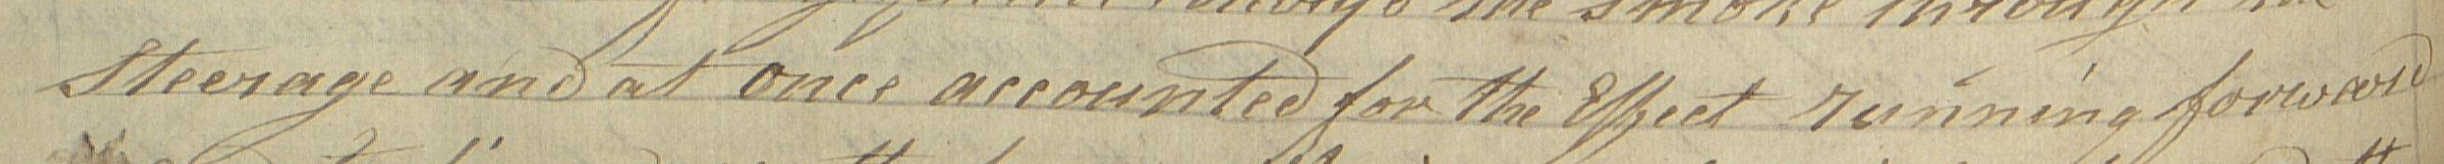Steerage and at once accounted for the Effect running forward
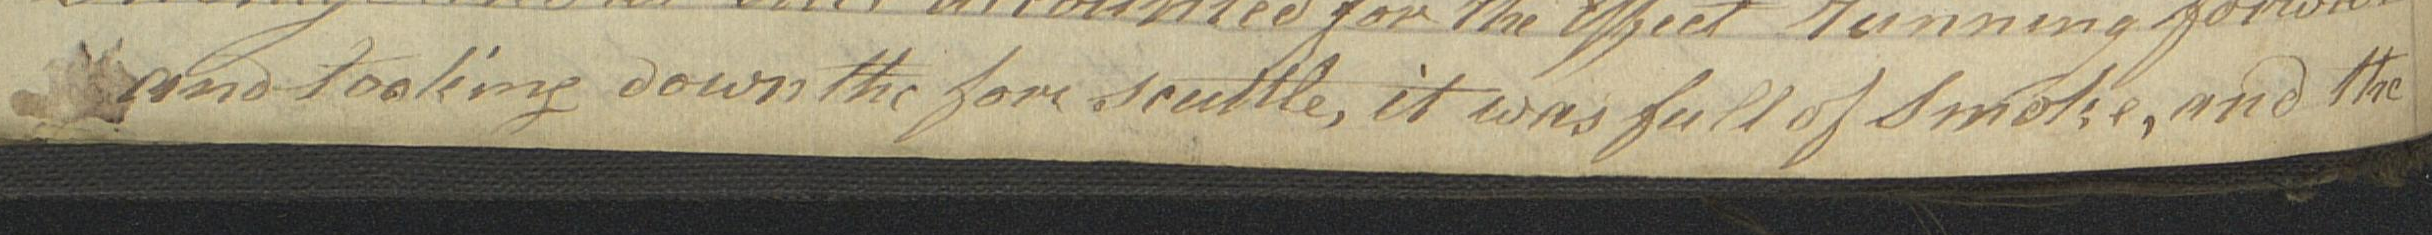and tooking down the fore scuttle, it was full of Smoke, and the
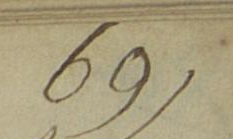69
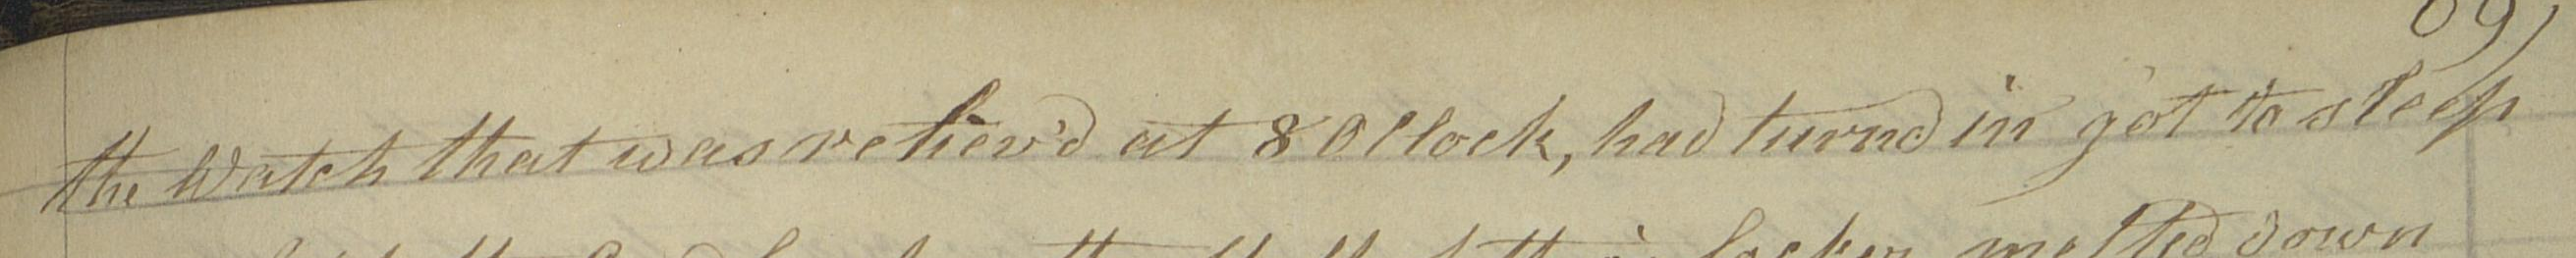the Watch that was reliev'd at 8 OClock, had turnd in got to sleep
